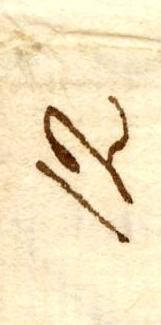12
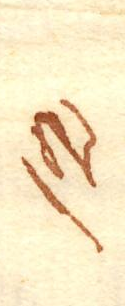12
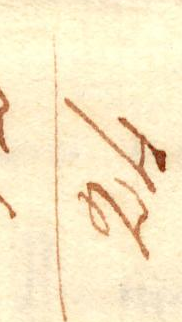24
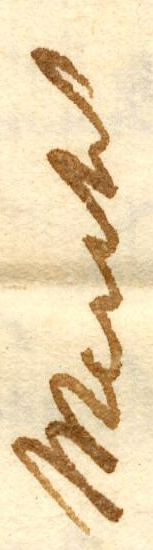Merch^t
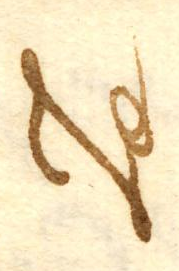To
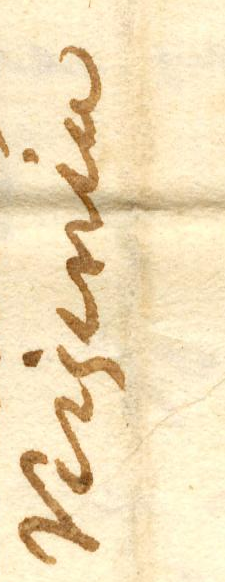Virginia
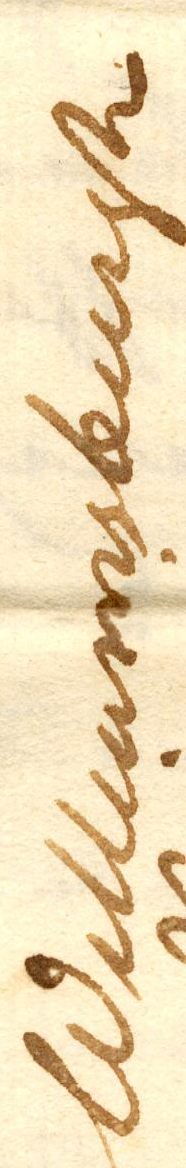WIlliamsburgh
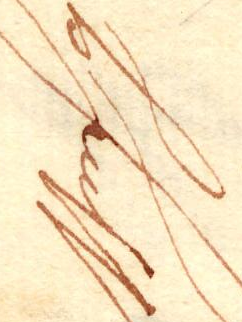M^r J G
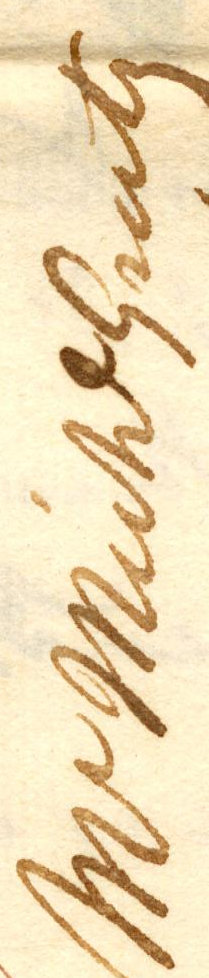M^r Mich^l Gratz
